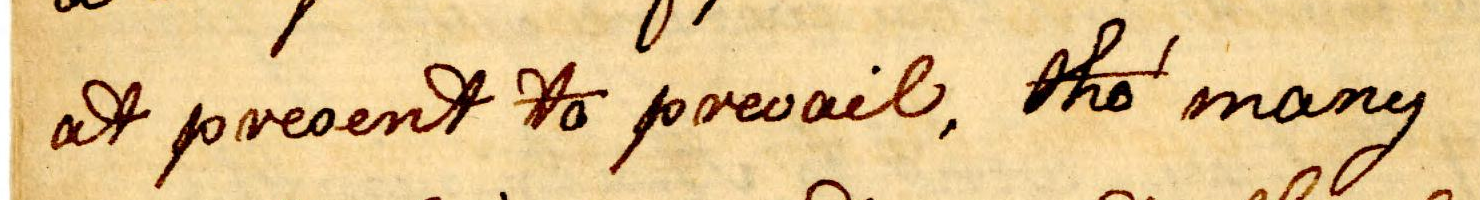at present to prevail, tho' many
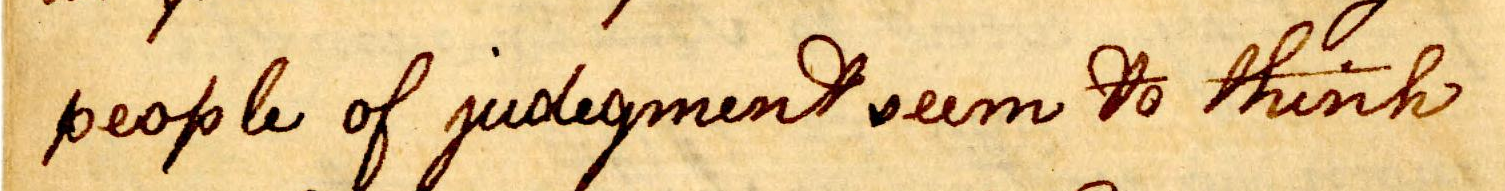people of judegment seem to think
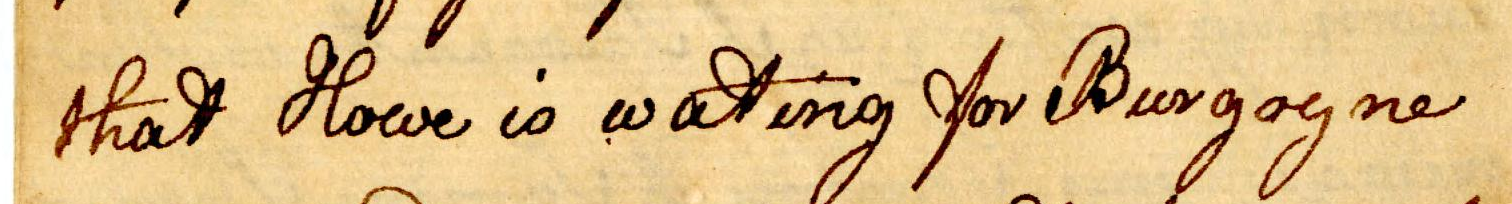that Howe is wating for Burgoyne
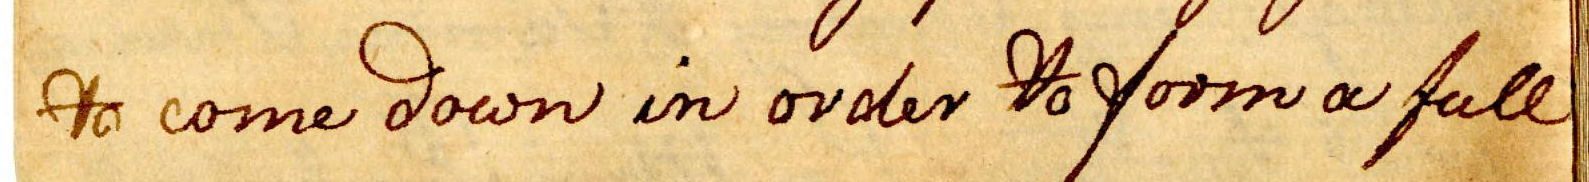to come down in order to form a full
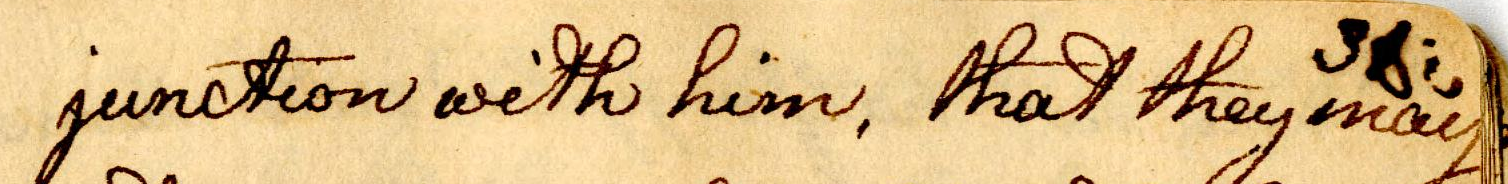junction with him, that they may
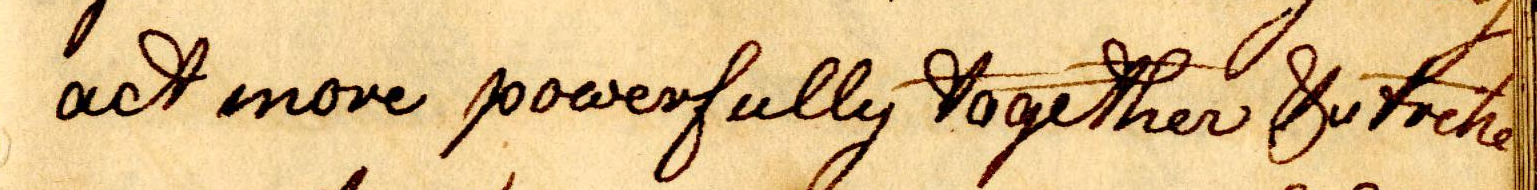act more powerfully together & strike
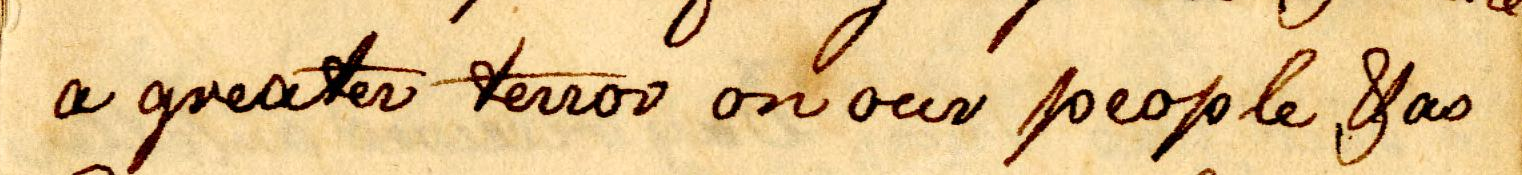a greater terror on our people & as
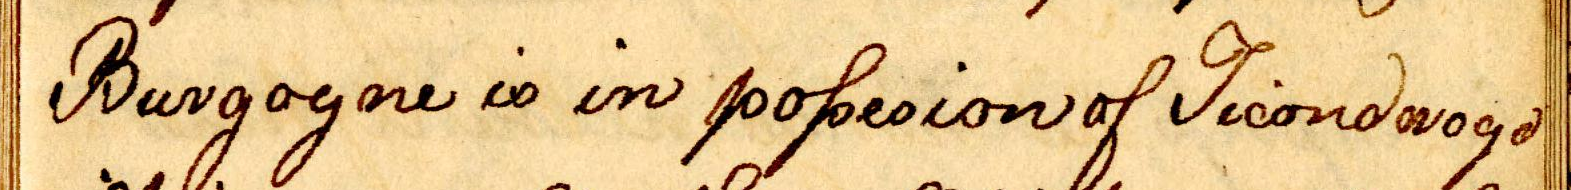Burgoyne is in possesion of Ticondorogo
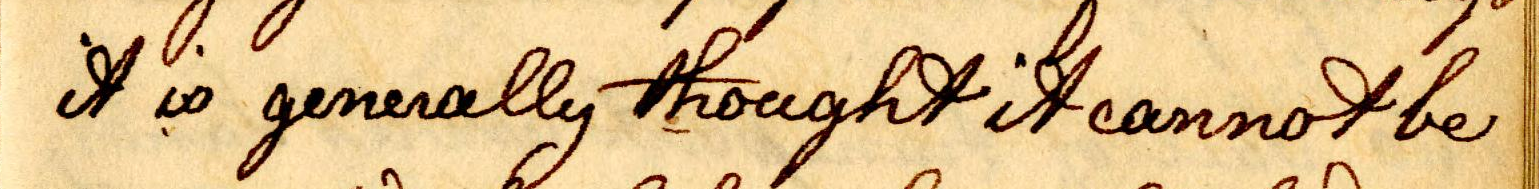it is generally thought it cannot be
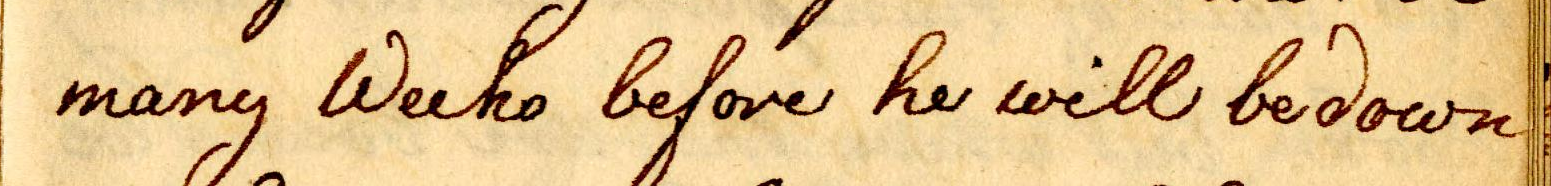many Weeks before he will be down
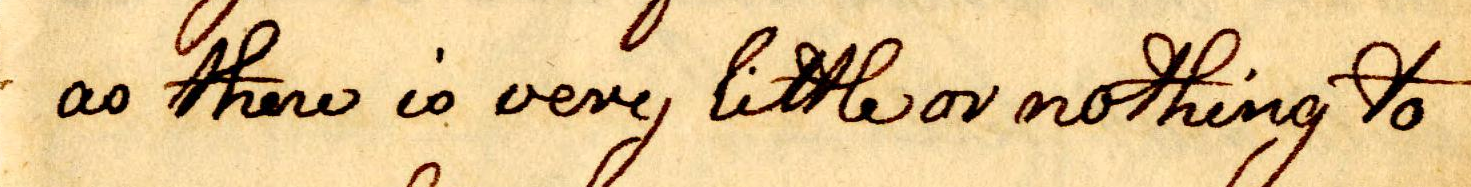as there is very little or nothing to
